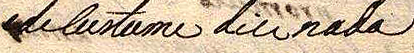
e de Custume dice nada
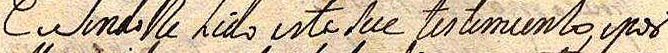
E sendolhe Lido este seu testemunho, e por
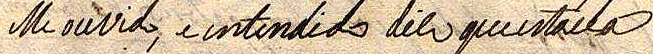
elle ouvido, e entendido dice que estaua
